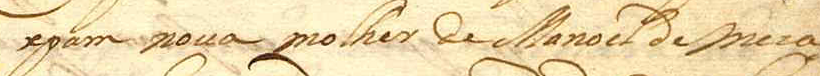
xpam noua molher de Manoel de mezas
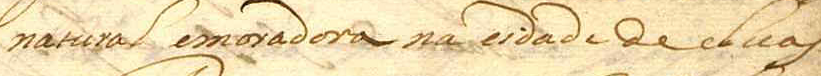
natural e moradora na cidade de eluas.
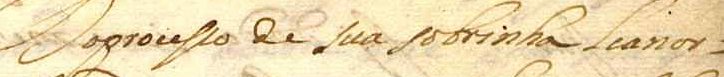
Do processo de sua sobrinha Leanor
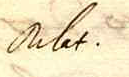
Delat.
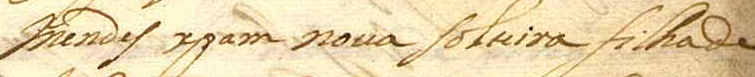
mendes xpam noua solteira filha de
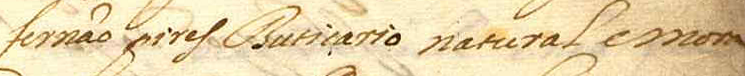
fernão pires Buticario natural e mora
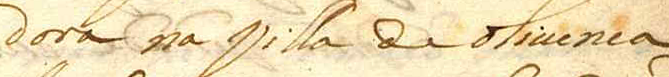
dora na Villa de oliuenca
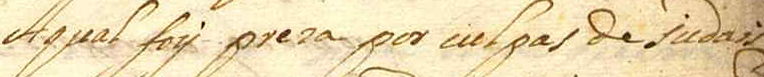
A qual foy preza por culpas de iudais
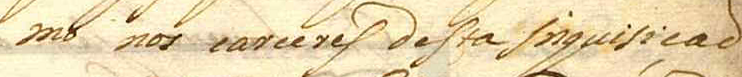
mo nos carceres desta Jnquisiçaõ
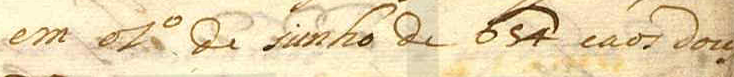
em o 1o de iunho de 654 e aos dous
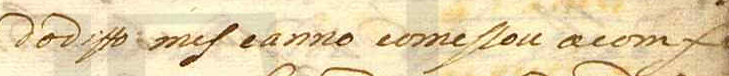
do ditto mes e anno comessou a comfe
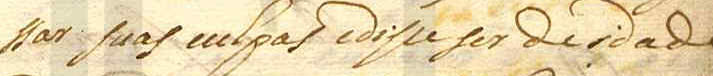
ssar suas culpas e disse ser de idade
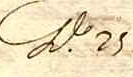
I.de 25
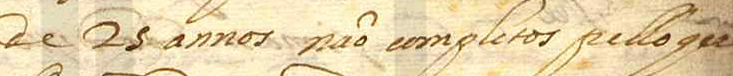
de 25 annos naõ completos pello que
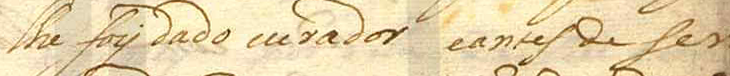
lhe foy dado curador e antes de ser
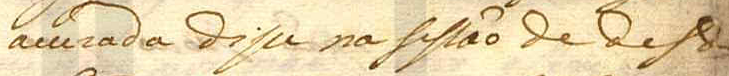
acuzada disse na sessaõ de des de
